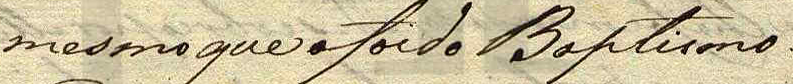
mesmo que o foi do Baptismo.
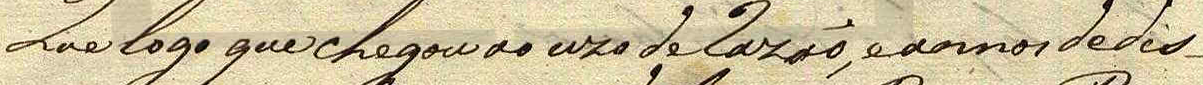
Que logo que chegou ao uzo de razaõ, e annos de dis
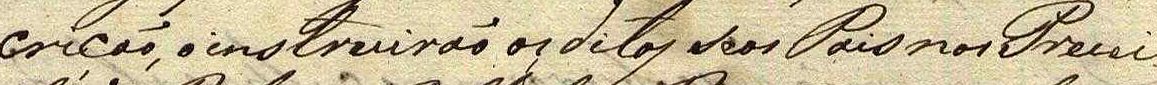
criçaõ, o instruiraõ os ditos seos Pais nos Precei
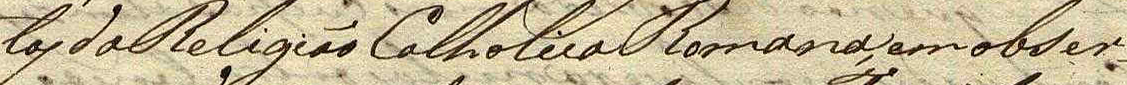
tos da Religiaõ Catholica Romana, em obser
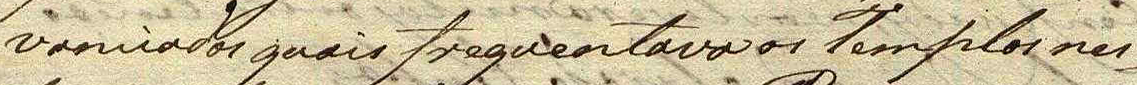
vancia dos quais frequentava os Templos nes
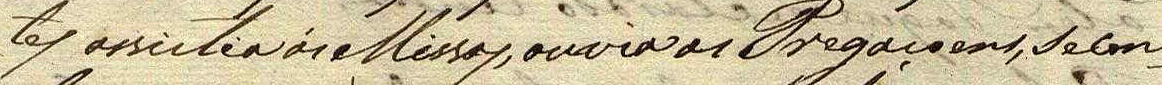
tes assistia ás Missas, ouvia as Pregaçoens, se con
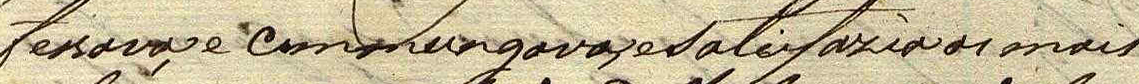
fessava e commungava, e satisfazia as mais
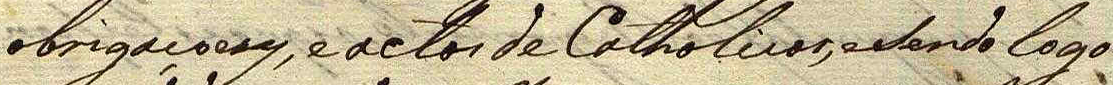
obrigaçoens, e actos de Catholicos, e sendo logo
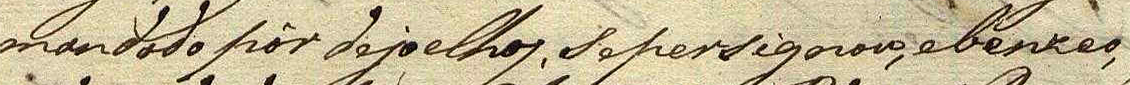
mandado pôr de joelhos, se persignava, e benzeo,
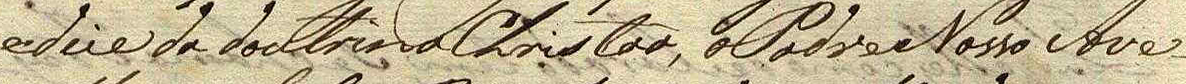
e dice da doctrina Christaã, o Padre Nosso Ave
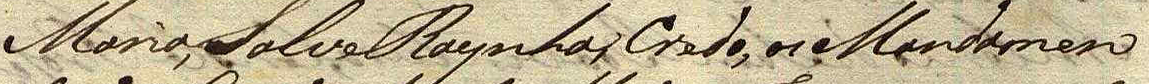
Maria, Salve Raynha, Credo, os Mandamen
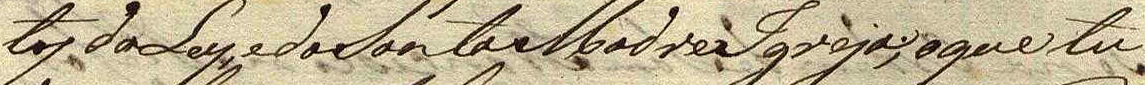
tos da Ley, e da Santa Madre Igreja; o que tu
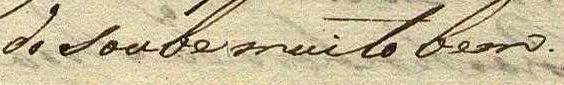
do soube muito bem.
